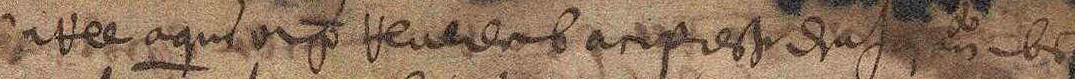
da Ree a quē o ħo Reuerendo açipreste deu Juramto dos
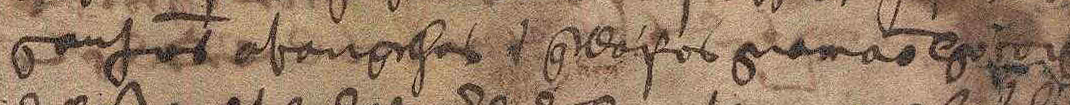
santos̄ avangelhos ē q̄ ela pos sua maõ e so cargo
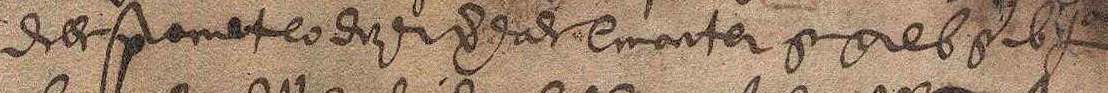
delle prometeo dizer ꝟdade e manter segredo sēdo ta
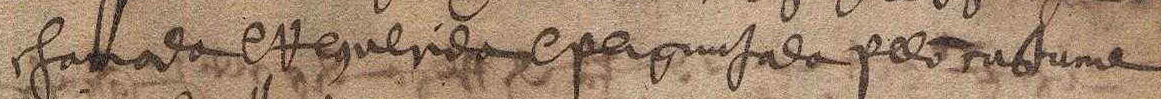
chamada e Requerida e perguntada pelo custume
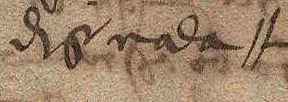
dise nada //
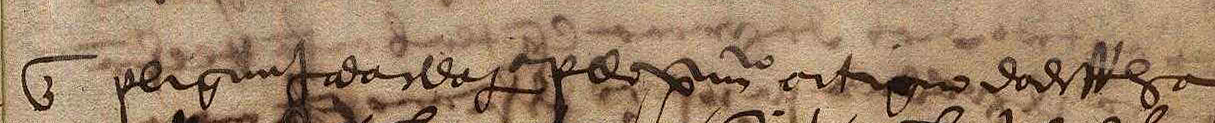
item perguntada ella ta pello primro artiguo da deffesa
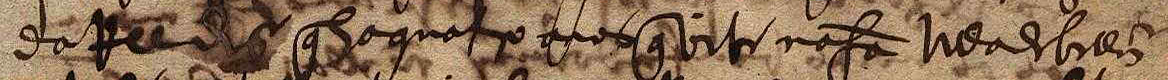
da Ree dise q̄ ha quatro anos q̄ vive na sa vila de bellmte
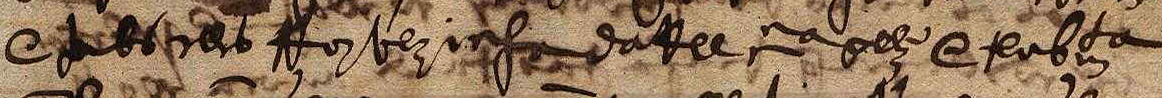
e todos elles ffoj vezinha da Ree cra gllz̄ e tendo mta
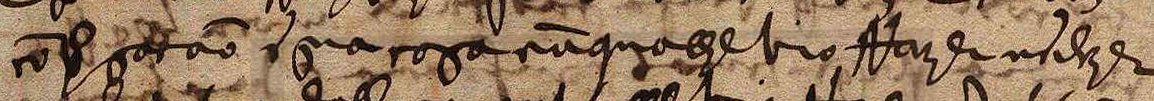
cōꝟsação ē sua casa nūqua lhe vio ffazer nē dizer
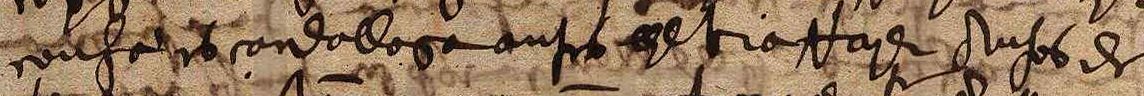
cousa escandallosa antes lhe via ffazer Autos de
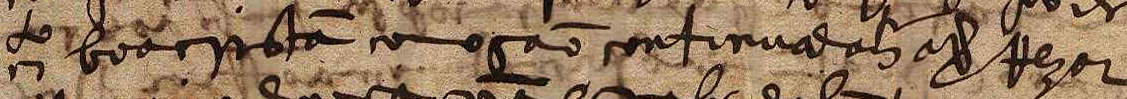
mto boa cristã como saõ continuadamte a ꝟ Rezar
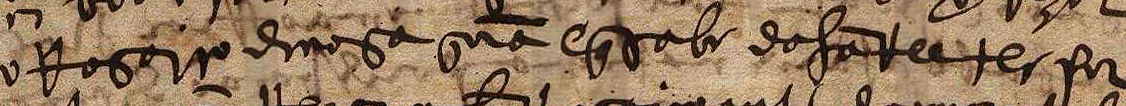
o Rosajro de nosa snā e q̄ sabe da ħa Ree ter por
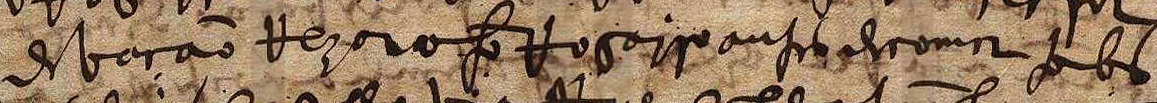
devocaõ Rezar o ħo Rosajro antes de comer todos
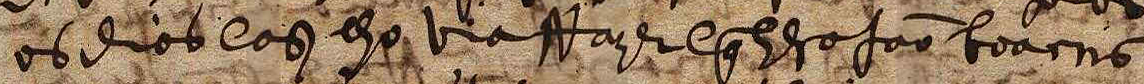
os dias e asj lho via ffazer e q̄ hera taõ boa cris
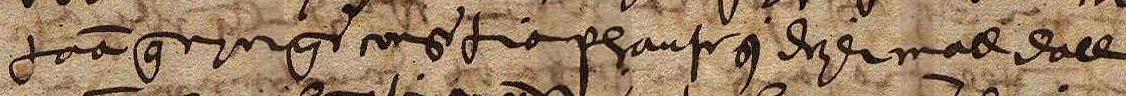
taã q̄ njngē consētia perante sj dizer mall dall
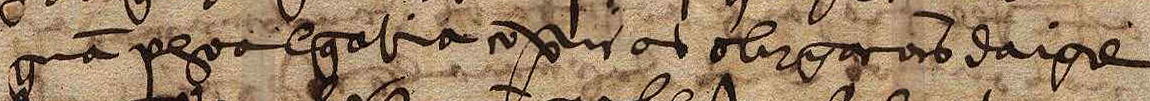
guā pesoa e q̄ a via c̄oprir os obrjgacoẽs da igre
